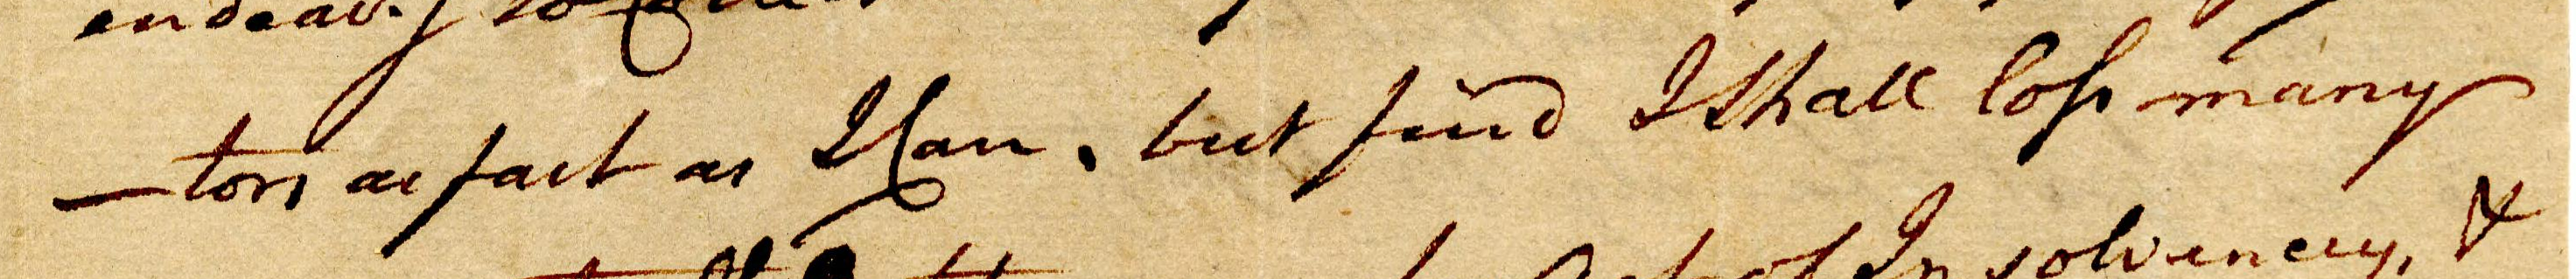-tors as fast as I can. but find I shall loss many
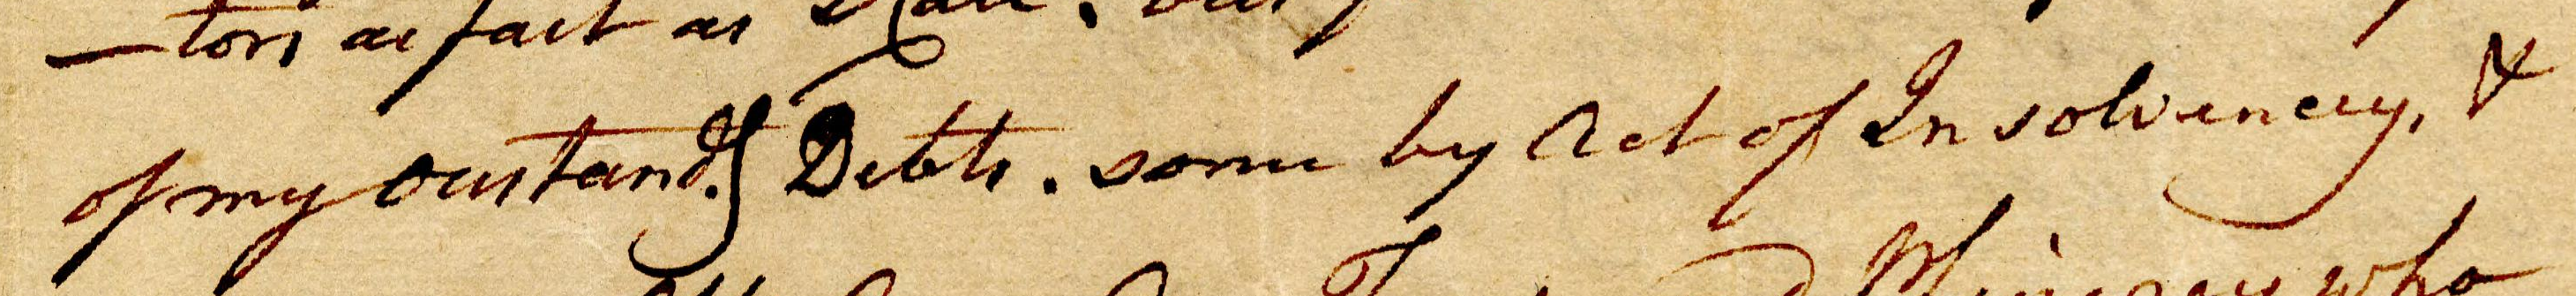of my oustand^g Debts. some by Act of Insolvencey, &
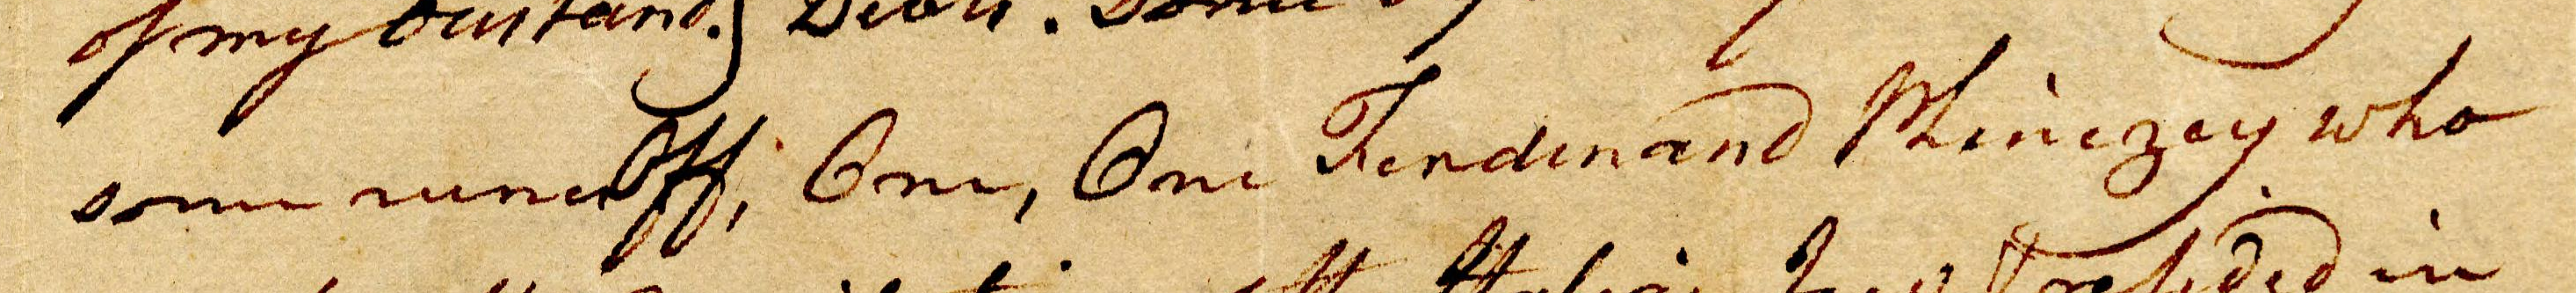some run off, one, one Ferdinand Phinezay who
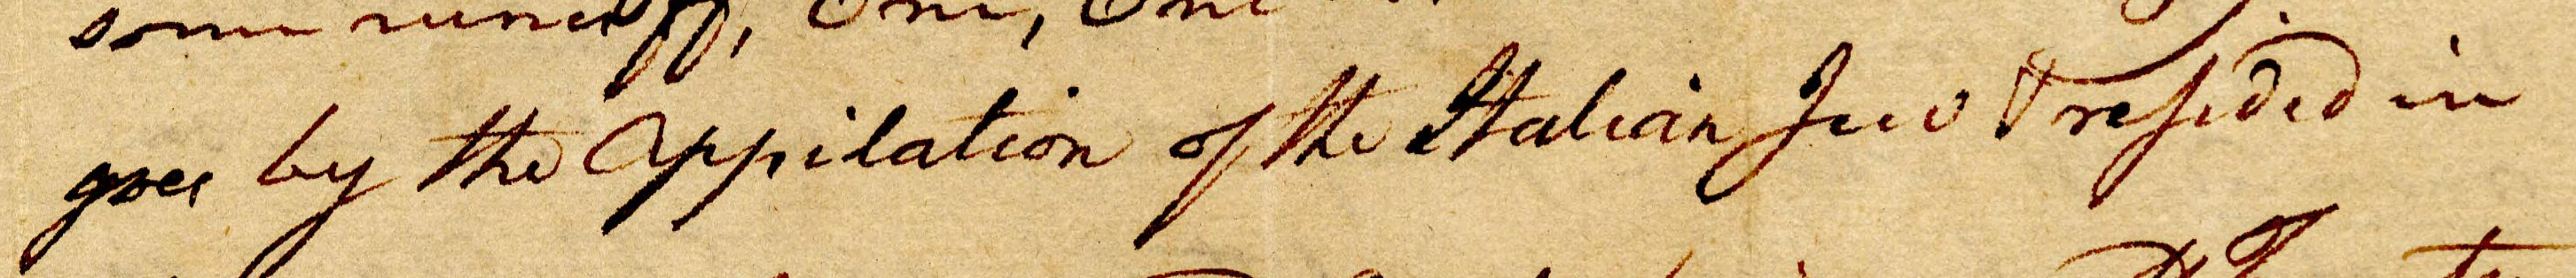goes by the appilation of the Italian Jews Presided in
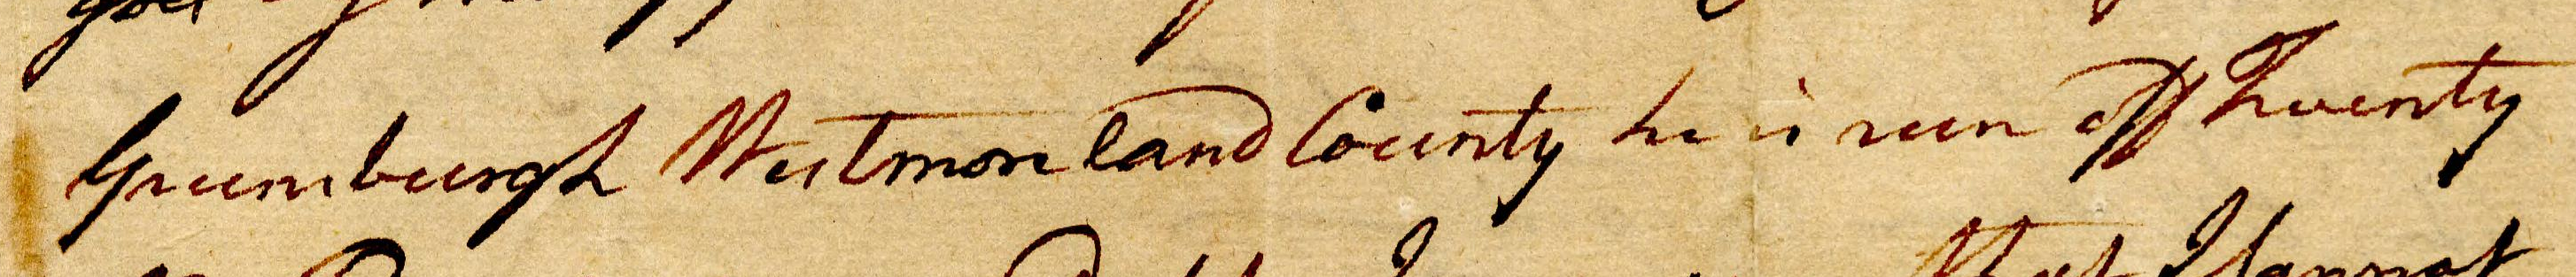Greenburgh Westmoreland County he is seen off Twenty
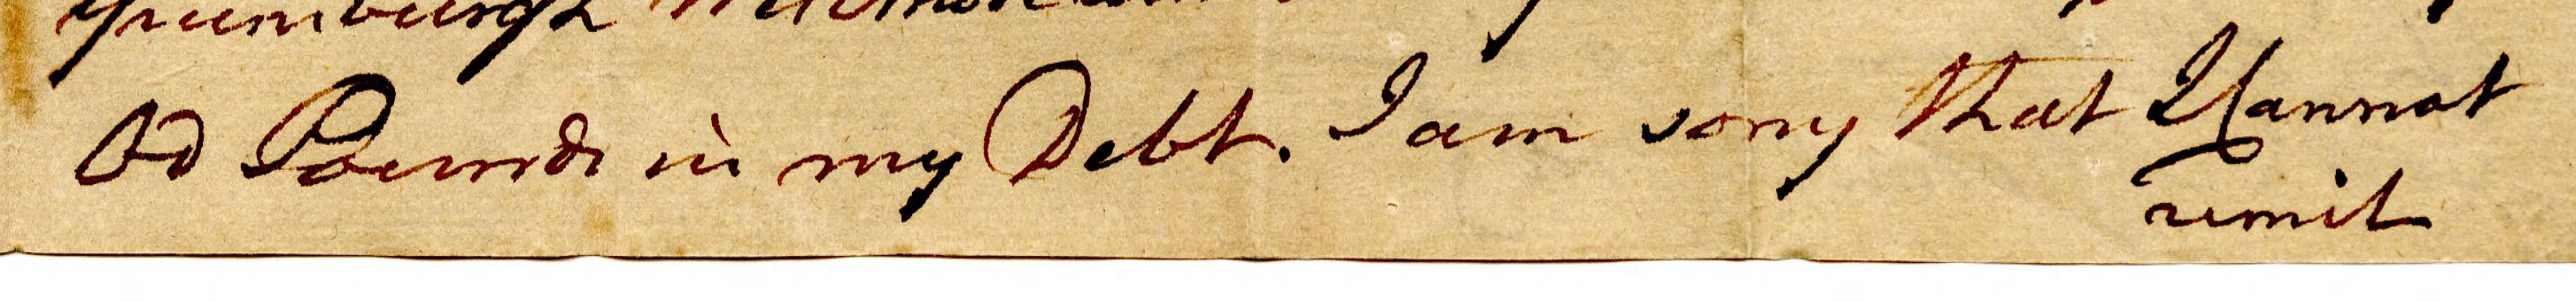Od Pounds in my Debt. I am sorry that I Cannot
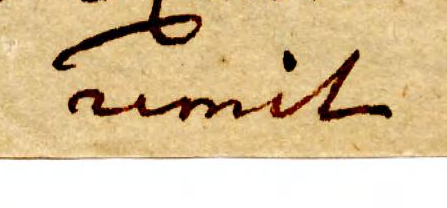remit
